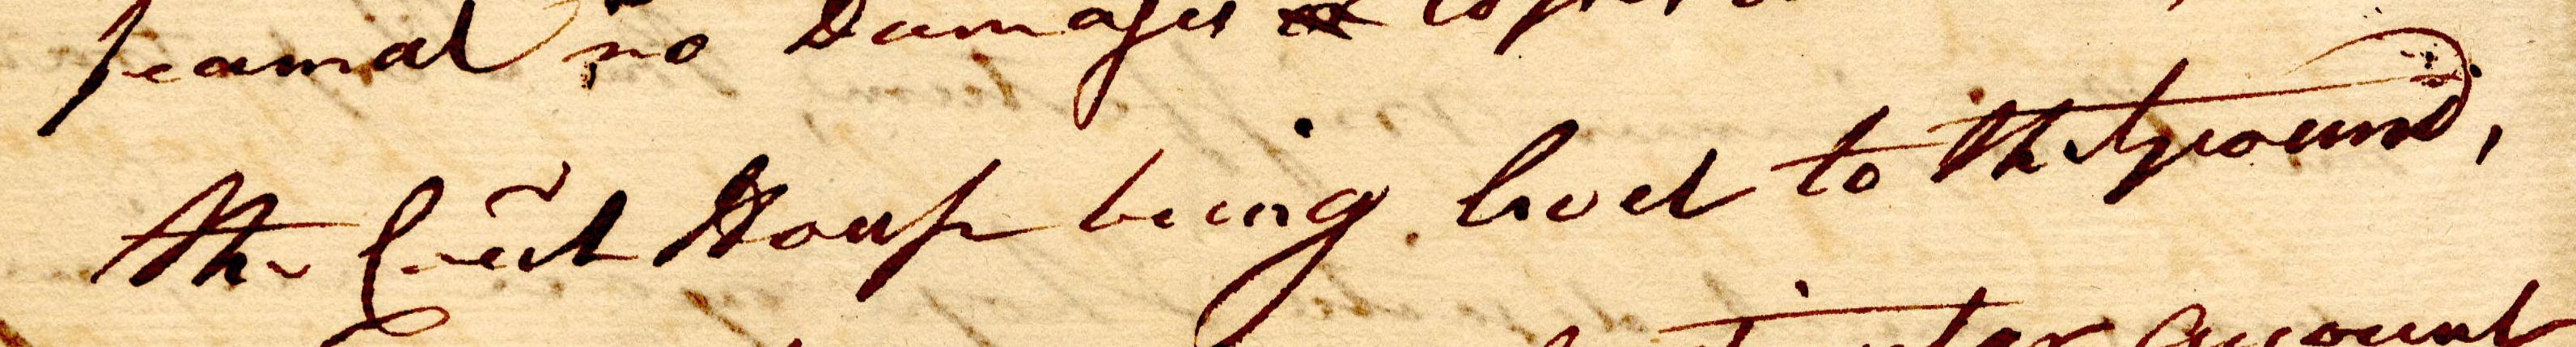the Court House being level to the ground,
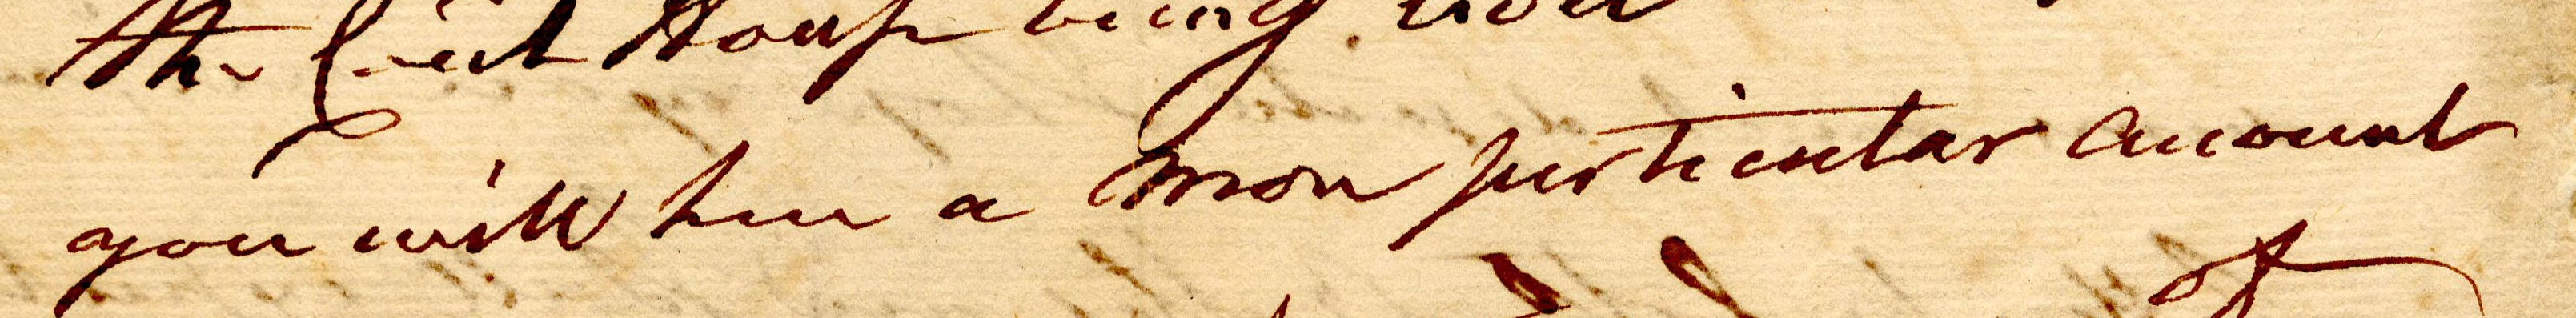you will here a more perticutar account
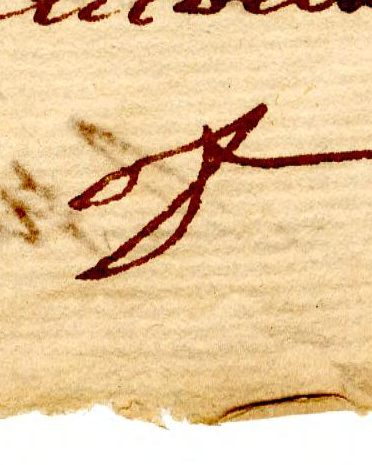of
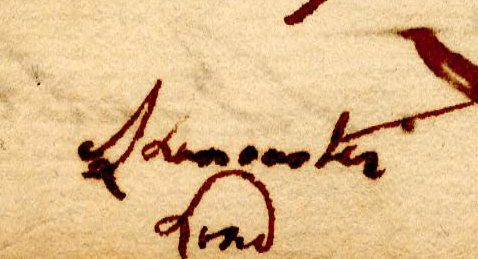Lancaster
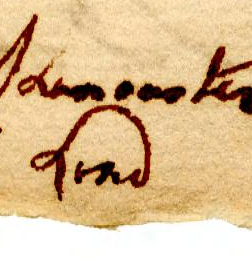Find
